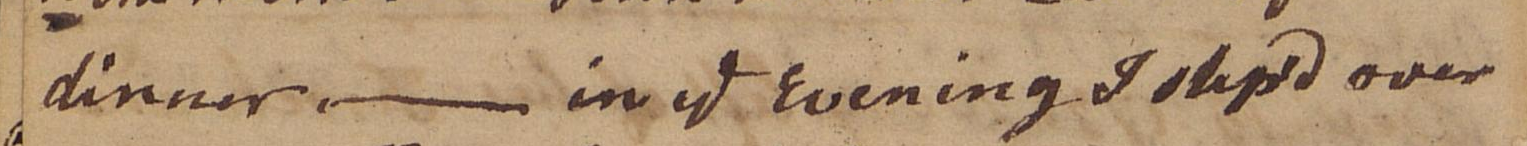dinner- in y^e Evening I step'd over
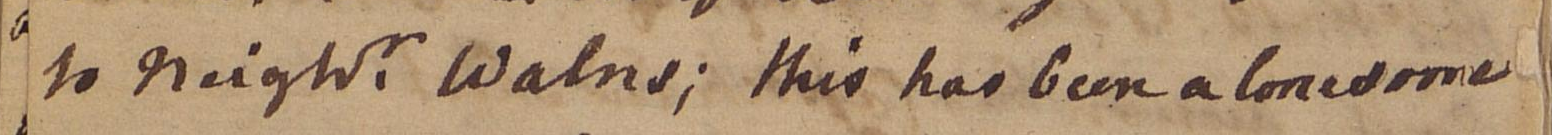to Neigh^r. Walns; this has been alonesome
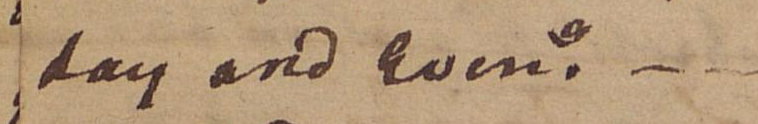day and Even^g.-
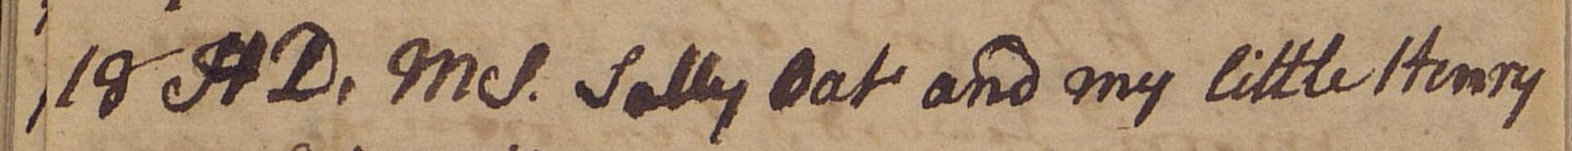18 HD. MS. Sally Oat and my little Henry
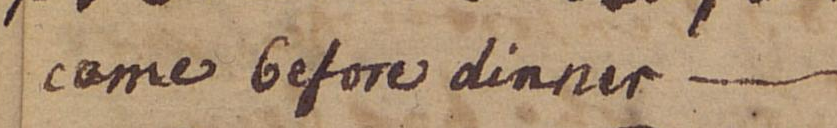came before dinner-
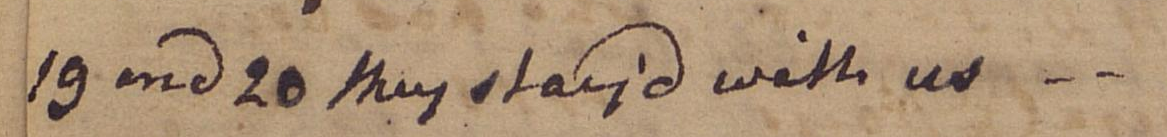19 and 20 they stay'd watl us--
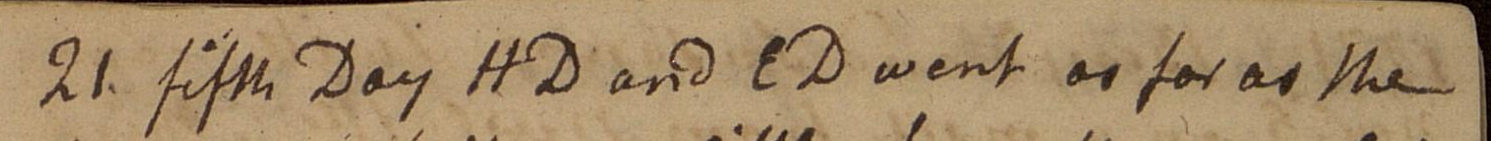21 fifth Day HD and ED went as far as the
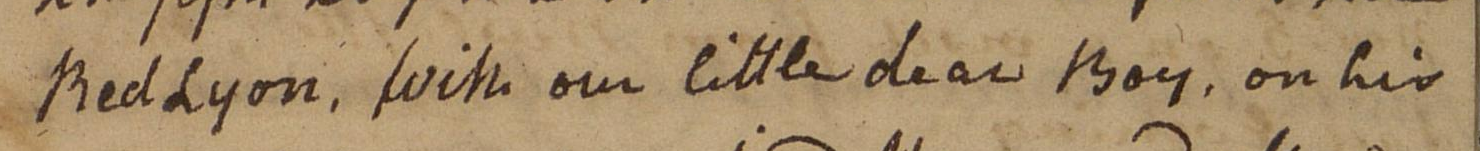Red Lyon, with our little dear Boy, on his
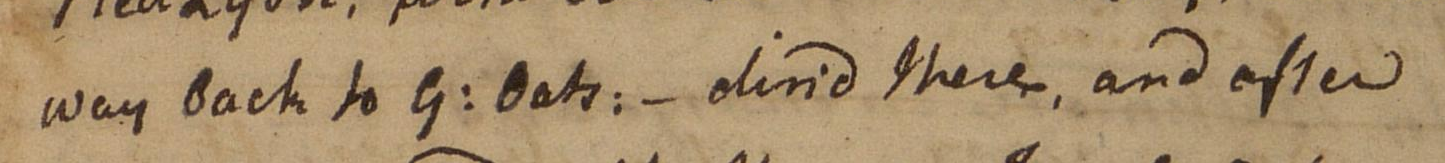way back to G: Oats.- din'd there, and after
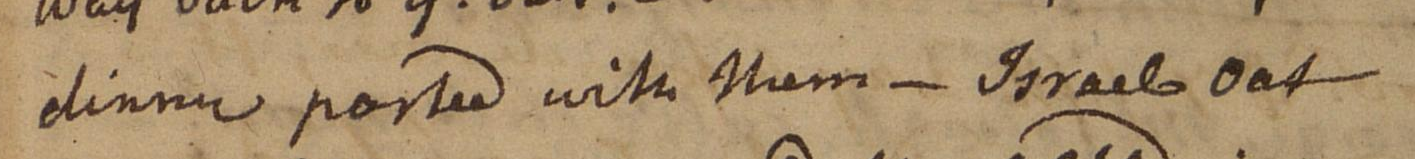dinner parted with them- Israel Oat
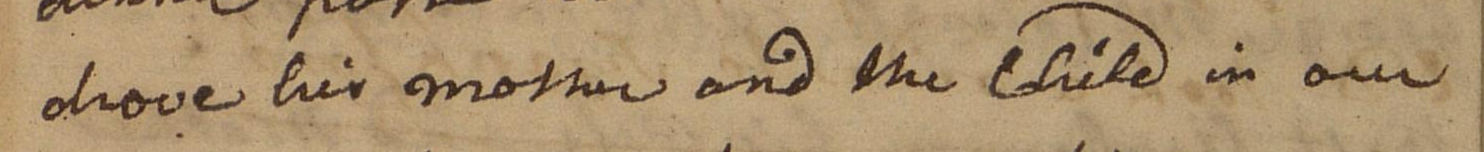drove his mother and the Child in our
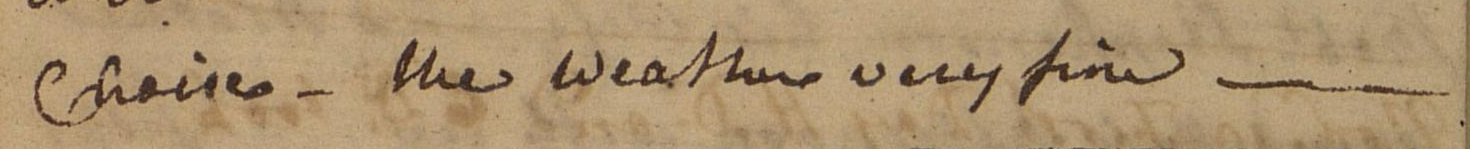Chaise- the Weather very fine-
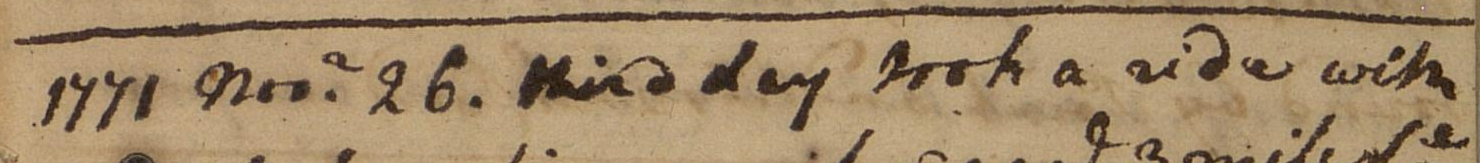1771 Nov^r. 26. third day took a ride with
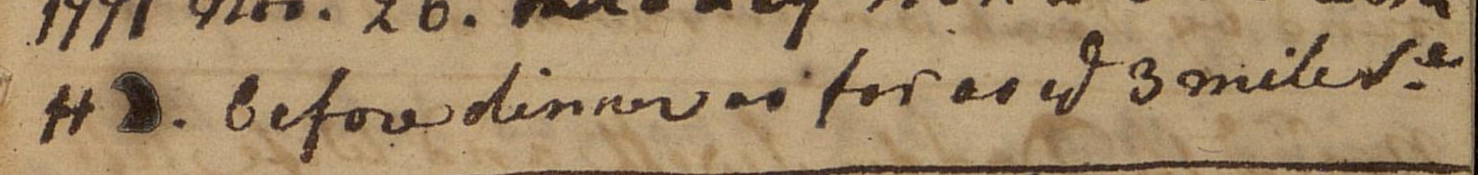HD. for dinner as far as y^e 3 mile s^e.
